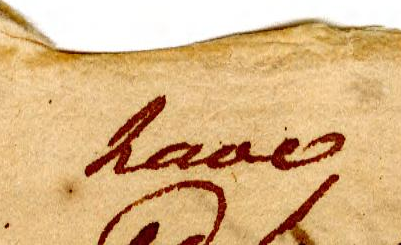have
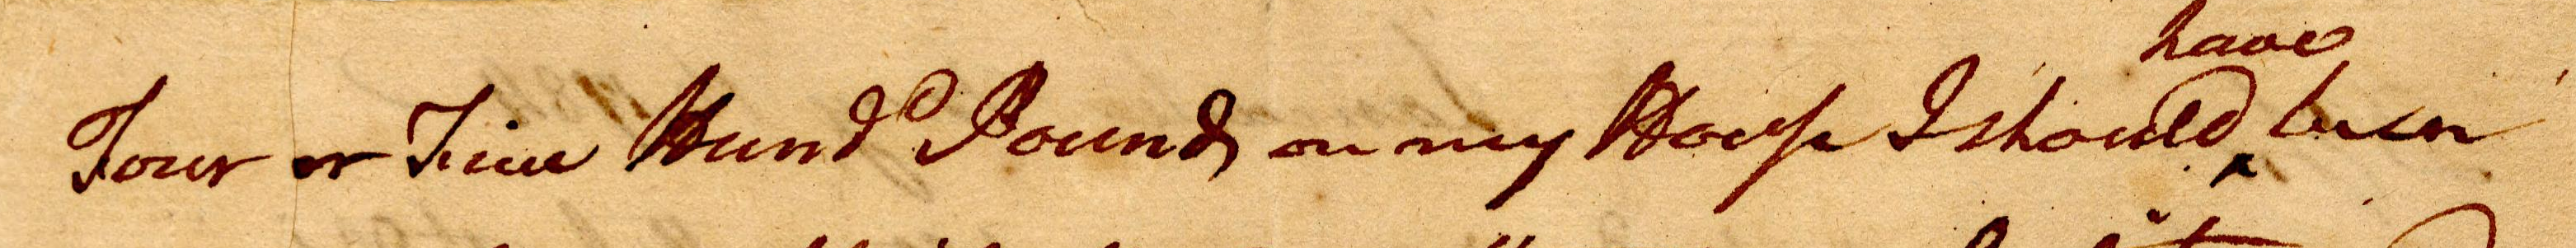Four or Five Hund^d Pounds on my House I should been
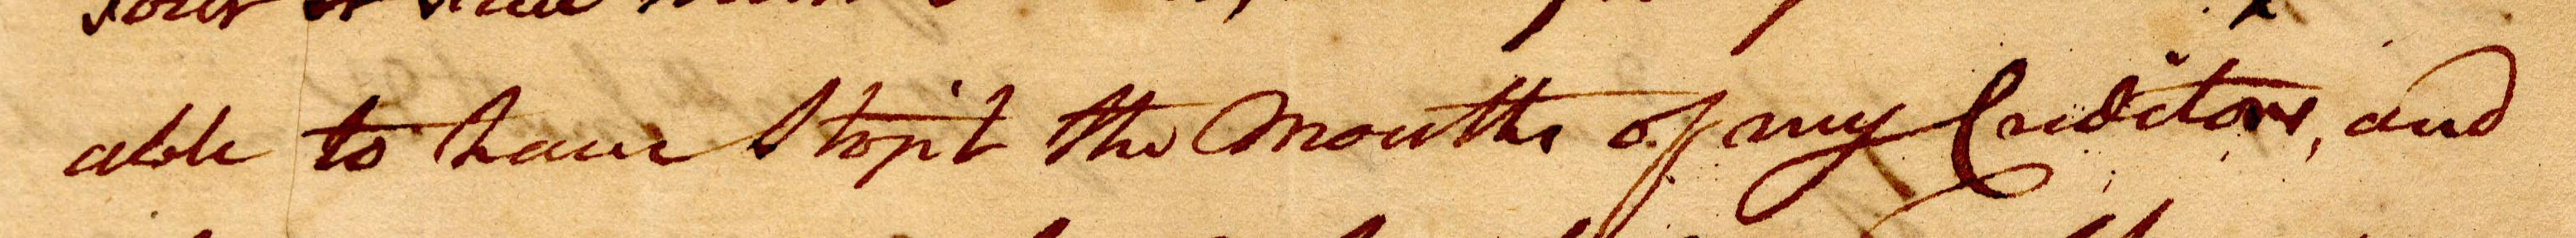able to have stop't the mouths of any Creditors, and
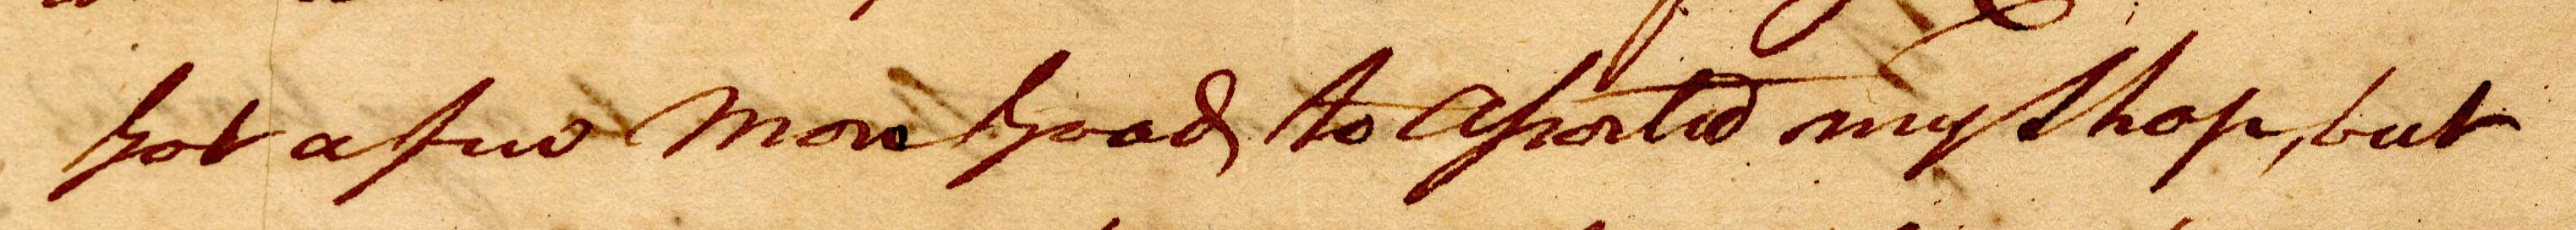for a few more Goods to assortd my shop but
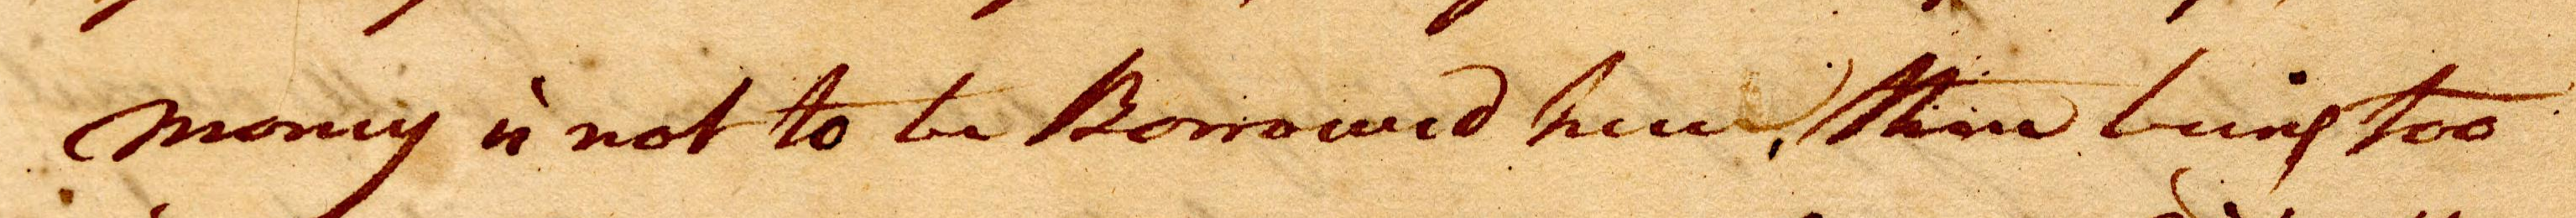money is not to be Borrowed here, there being too
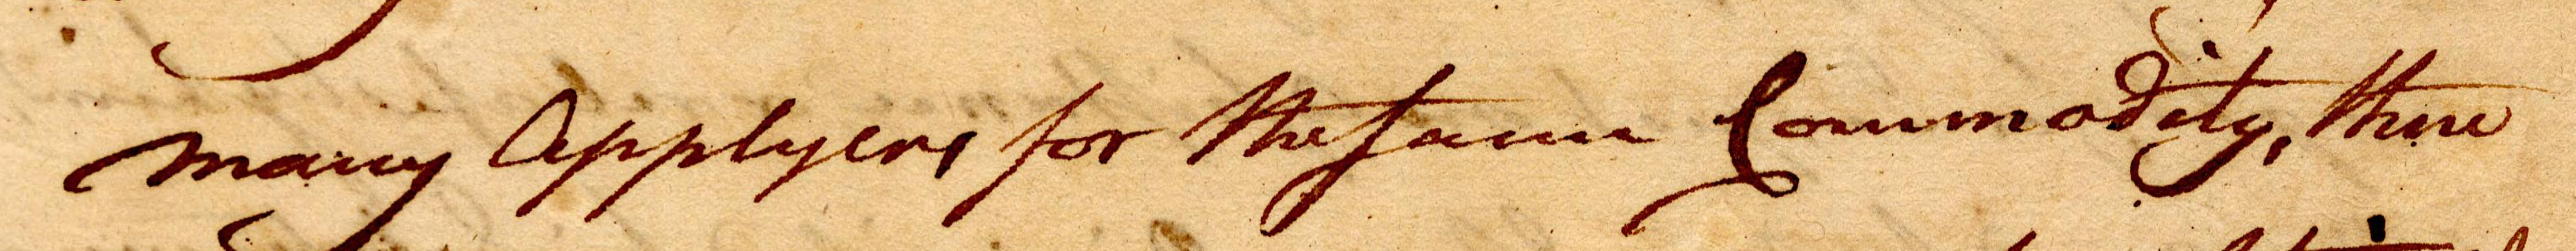many Applyers for the same Commodity, there
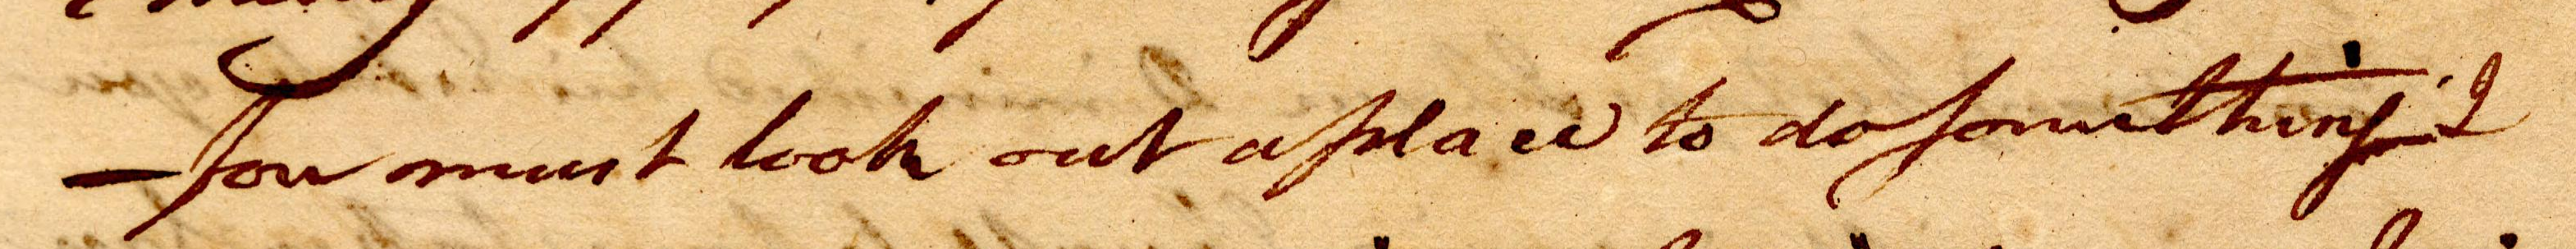-for must look out a place to do something I
